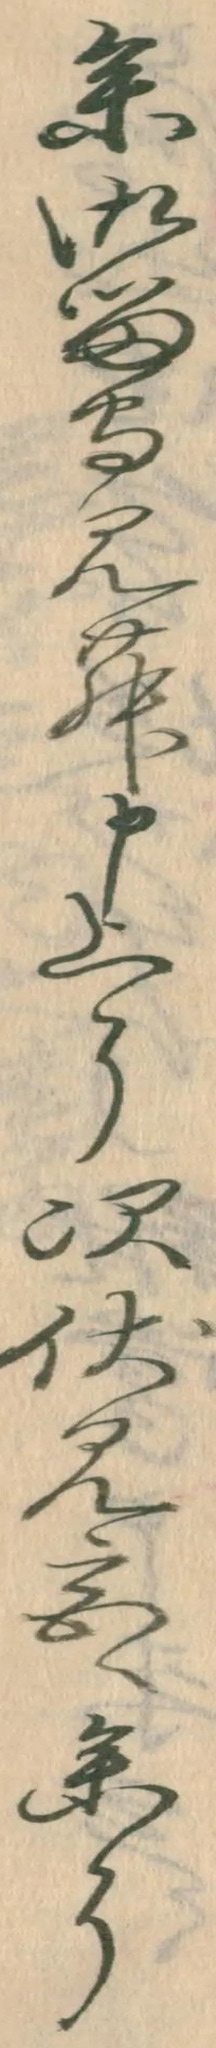参御留守見舞申上了次伏見宮へ参了
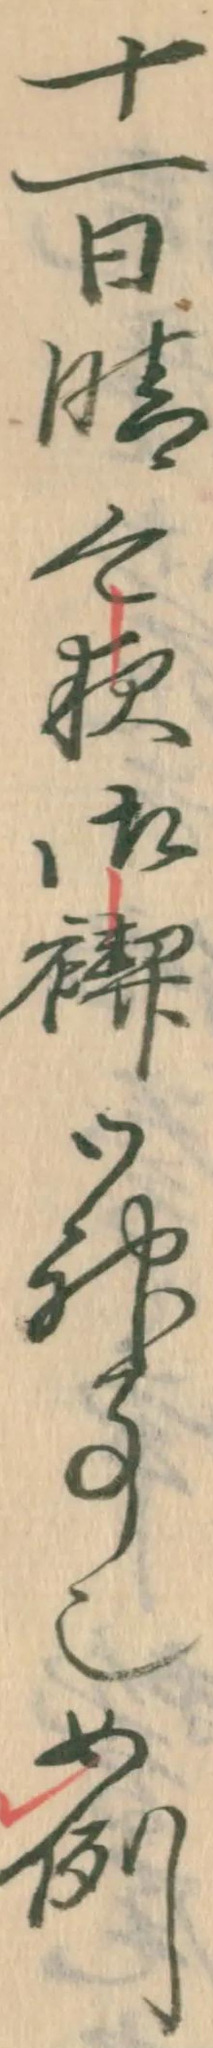十一日晴今-夜御-禊御神事也如例
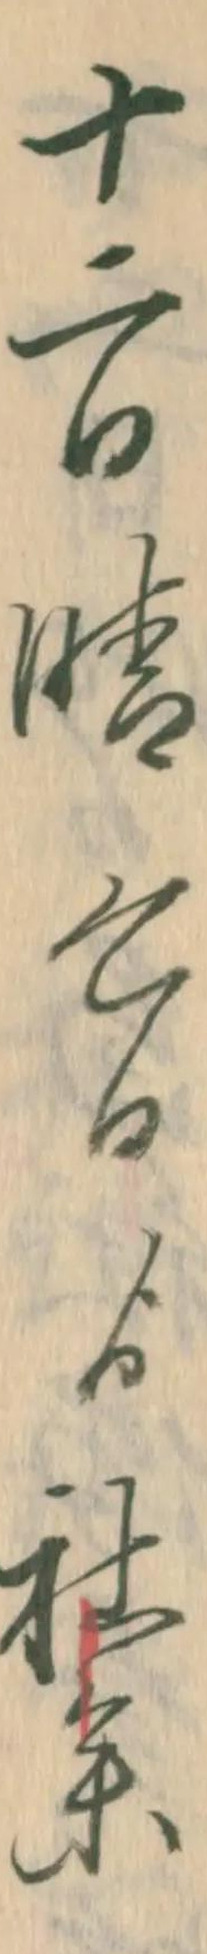十二日晴今日ゟ社-参
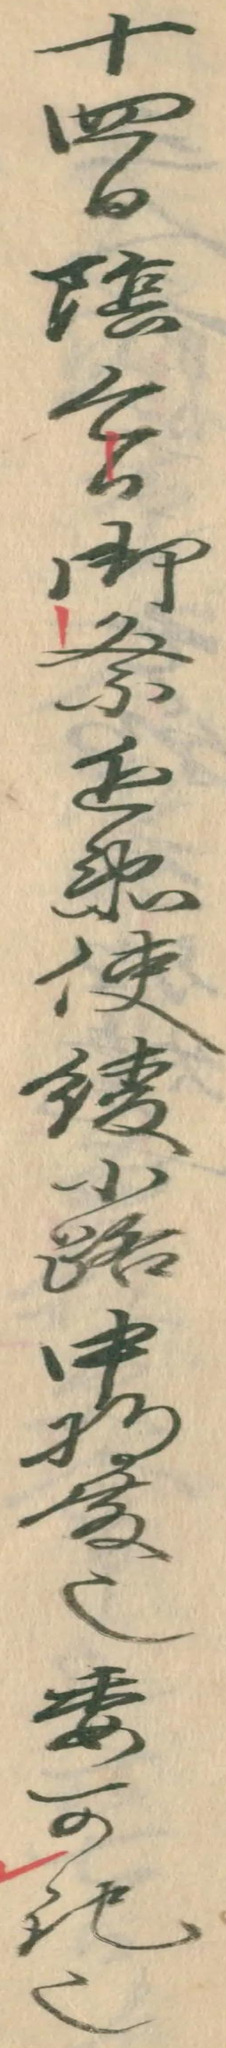十四日陰今-日御_祭近衛使綾小路中将殿也委可記也
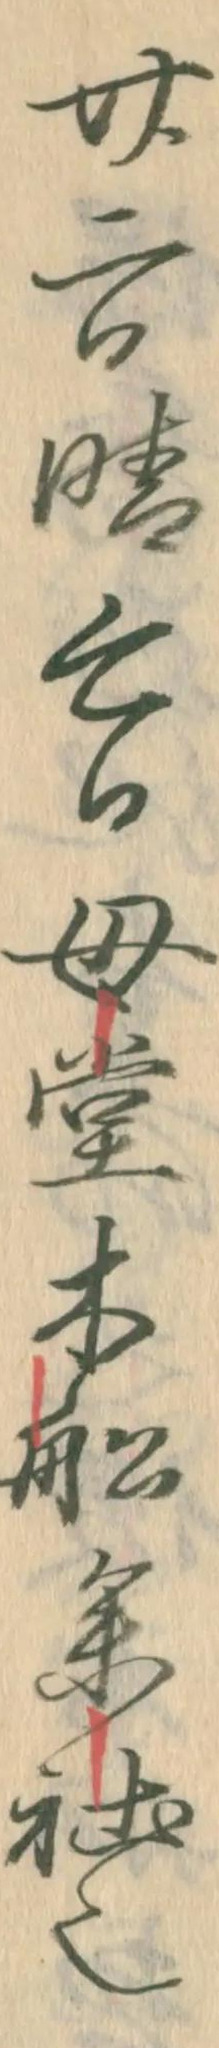廿二日晴今日母-堂木_船参-社也

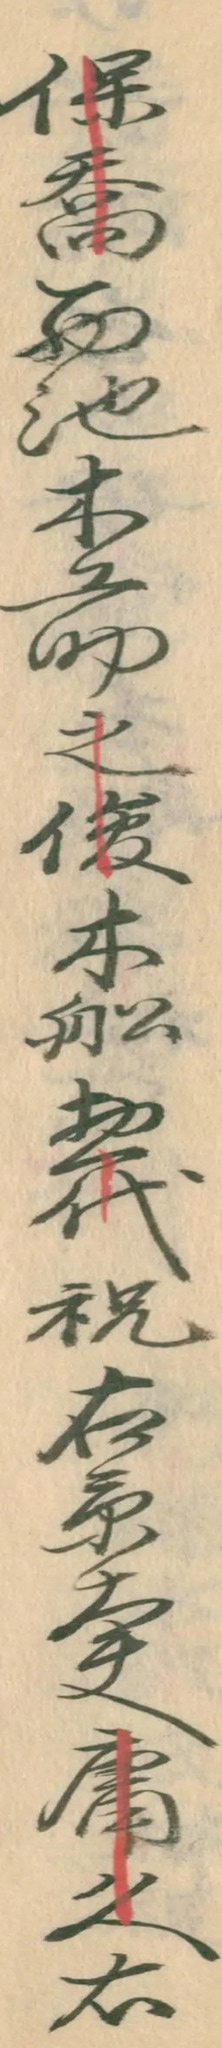保喬西池木工助之俊木船惣-代祝右京大夫庸久右
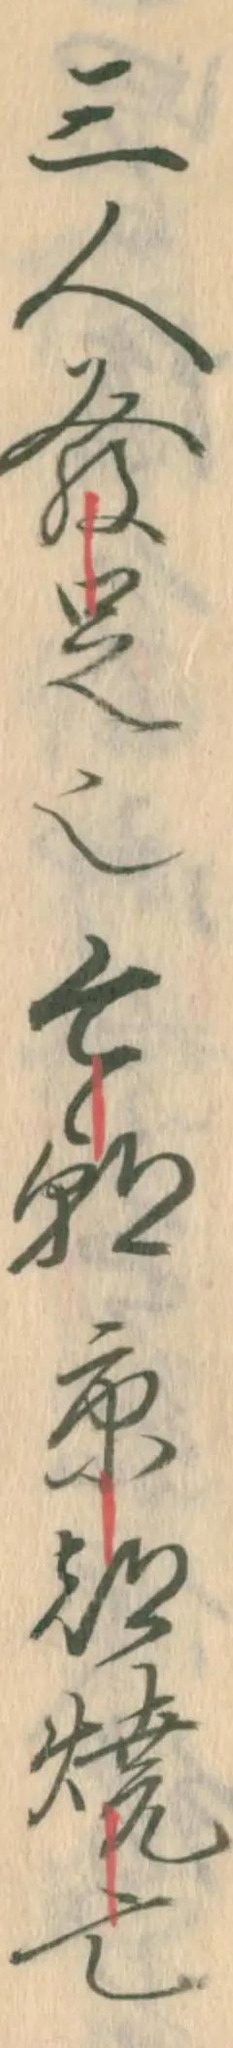三人発-足也今-朝京-都焼-亡
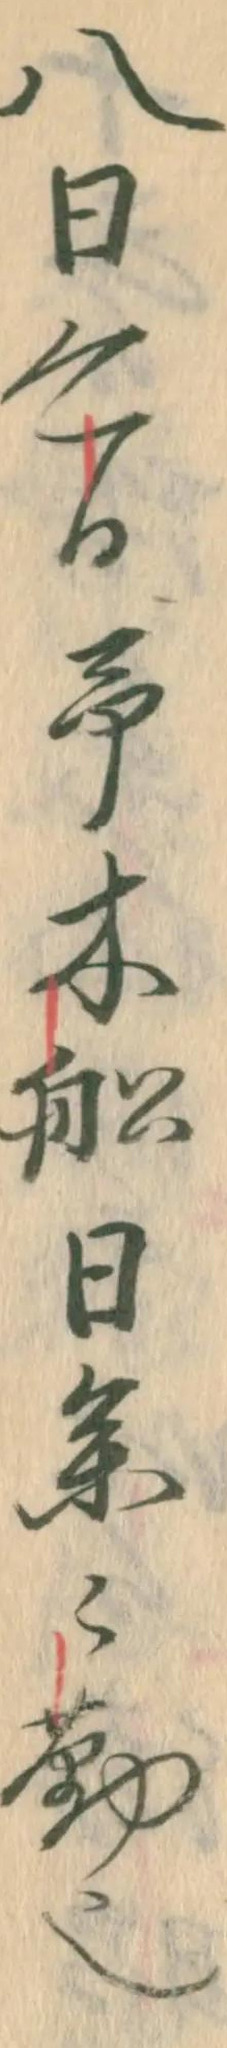八日今-日予木_船日参々_勤也
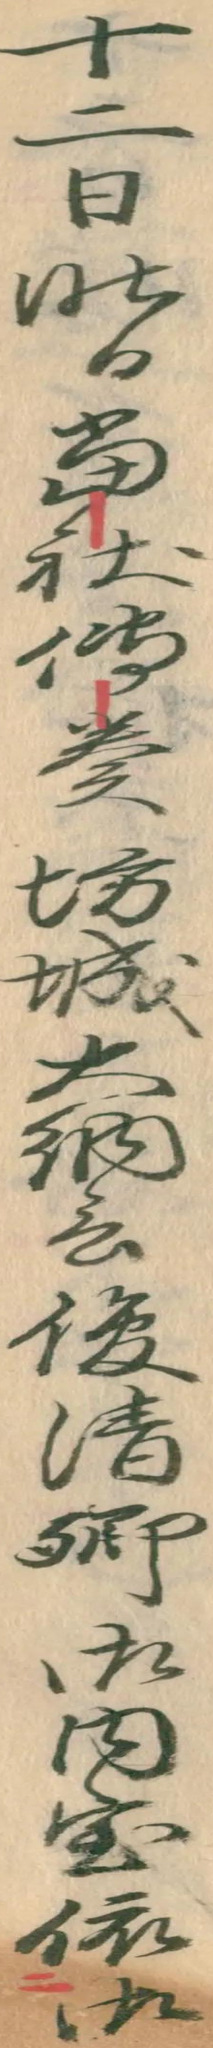十二日昨日当-社伝-奏坊城大納言俊清卿御内室依御
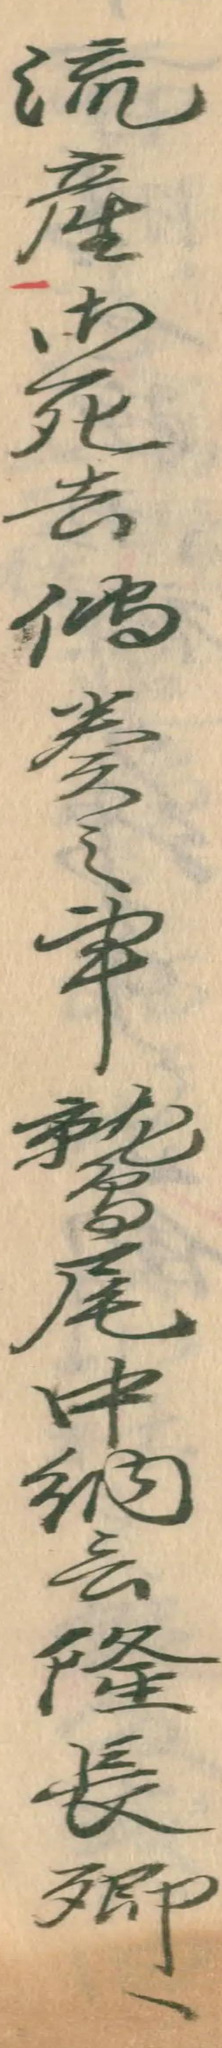流産御死去伝奏之事鷲尾中納言隆長卿へ
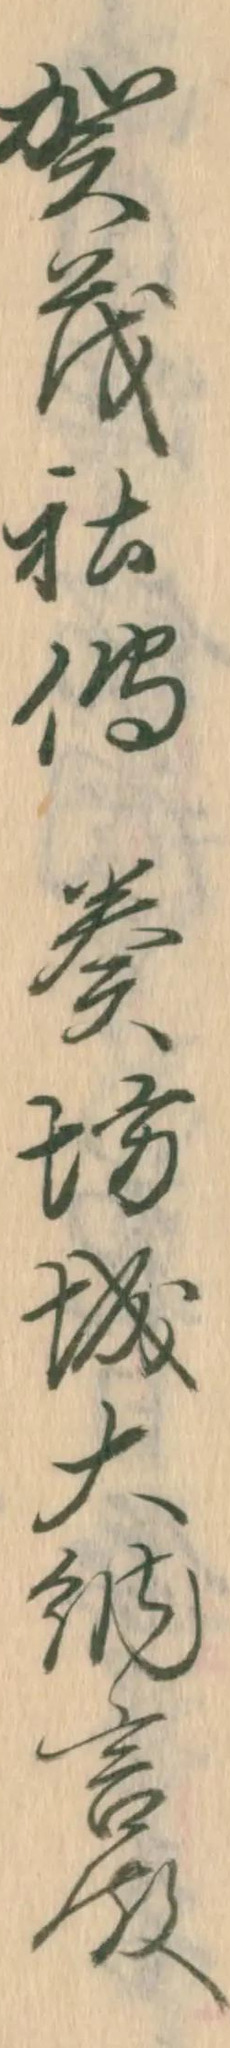賀茂社伝奏坊城大納言殿
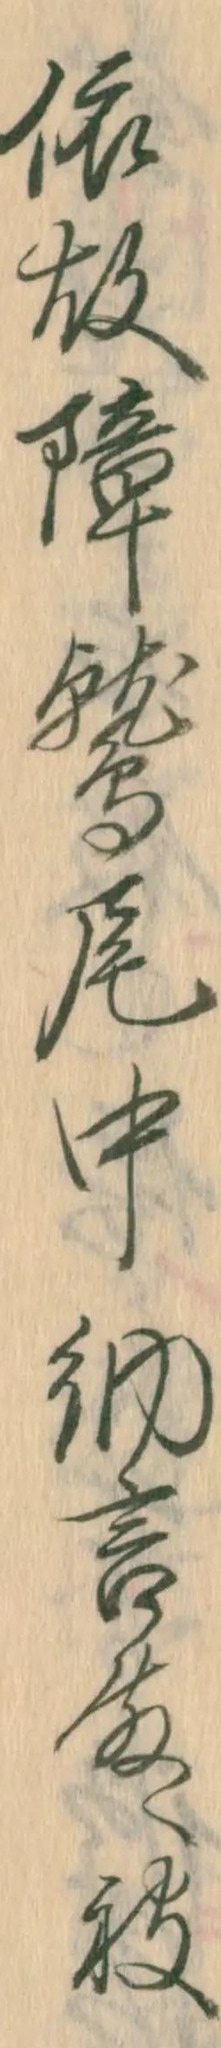依故障鷲尾中納言殿へ被
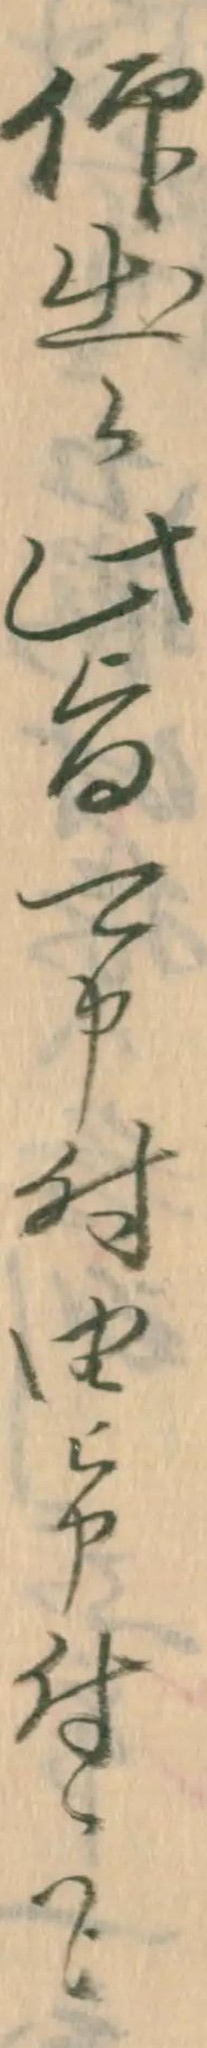仰出候此旨可申付由被申付候以上
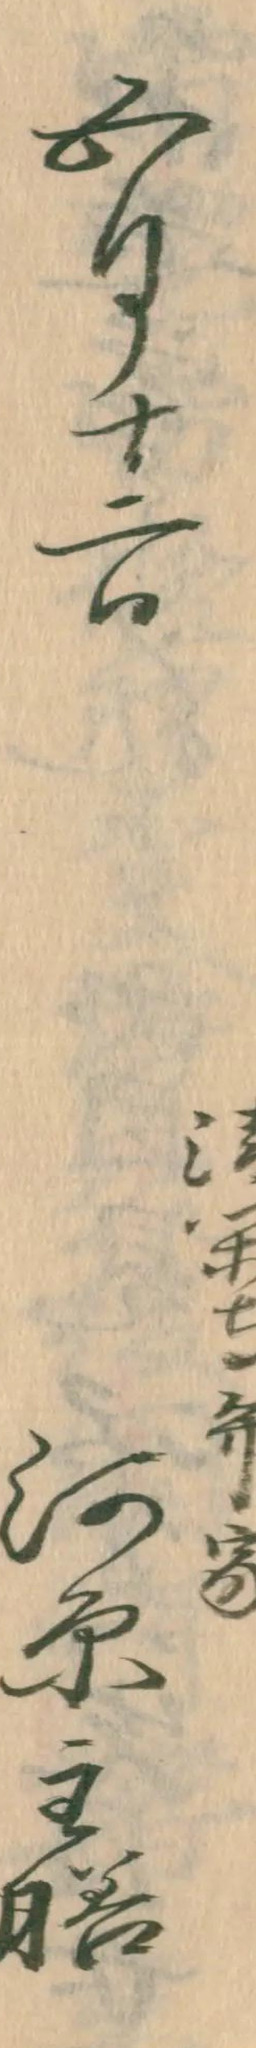五月十二日河原主膳
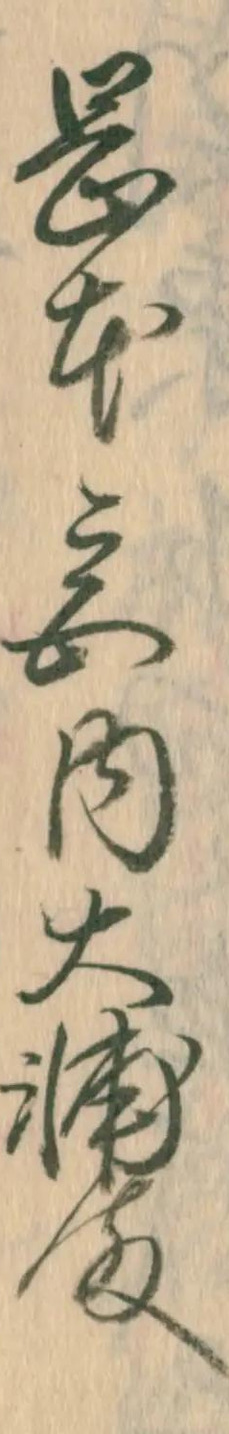岡本宮内大輔殿
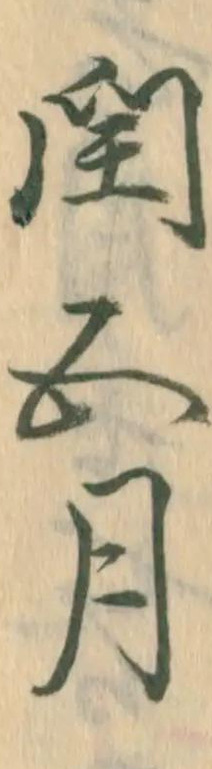閏五月
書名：賀茂社記録. 第16冊
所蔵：国立国会図書館 National Diet Library, JAPAN
